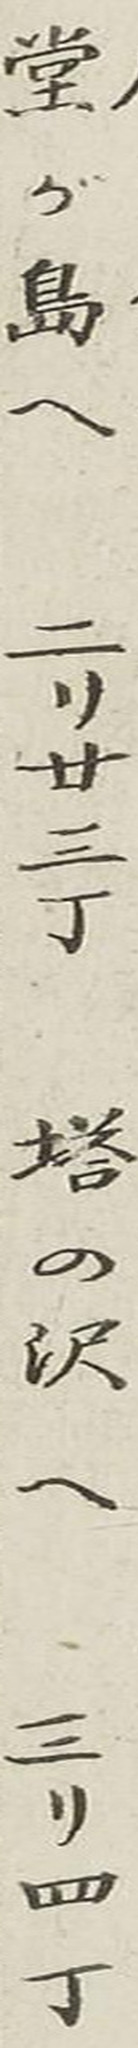堂が島へ二り廿三丁塔の沢へ三り四丁
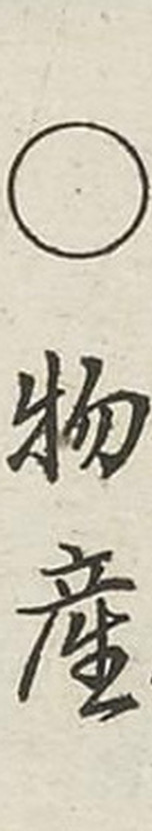○物産
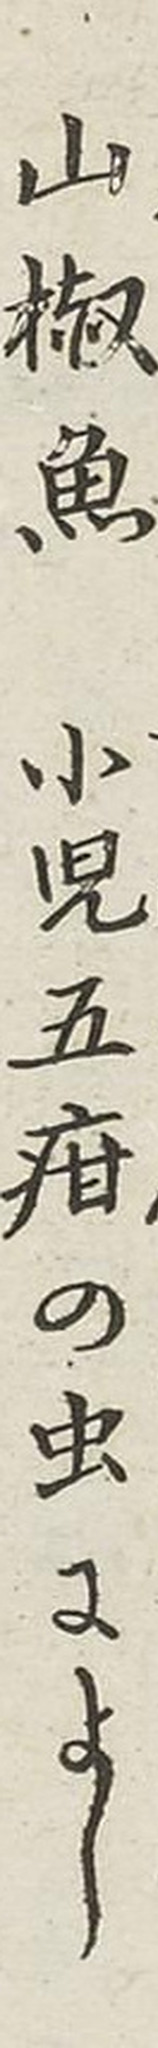山椒魚小児五疳の虫によし
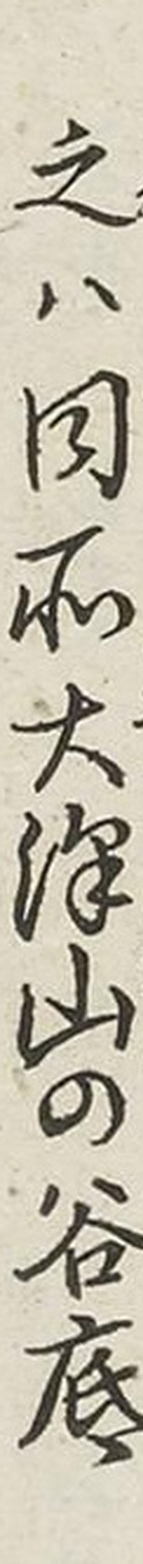之は同所大沢山の谷底
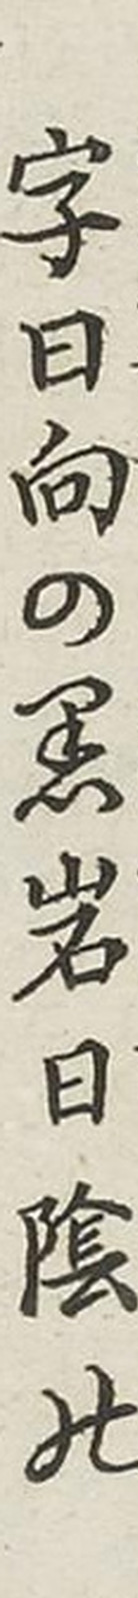字日向の黒岩日陰の
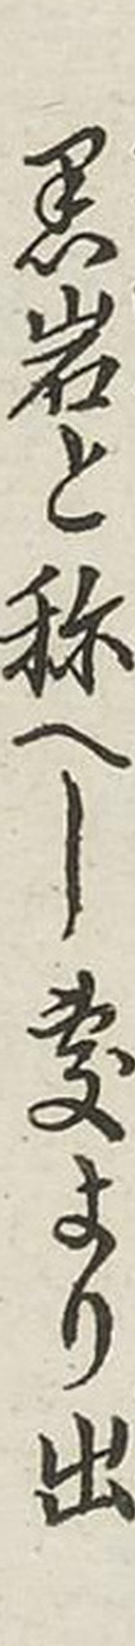黒岩と称へし処より出
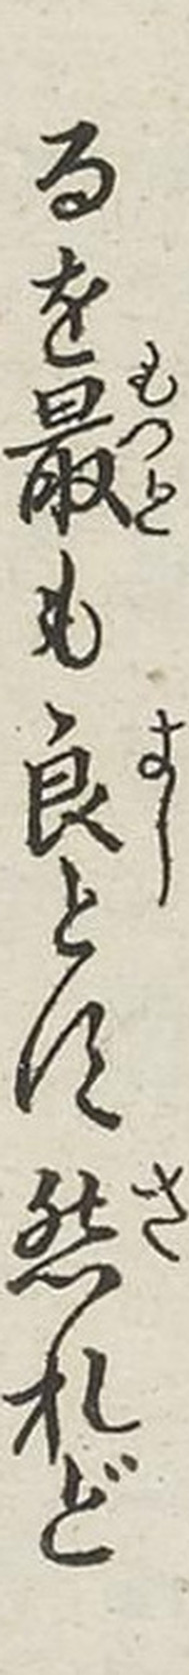るを最も良とす然れど
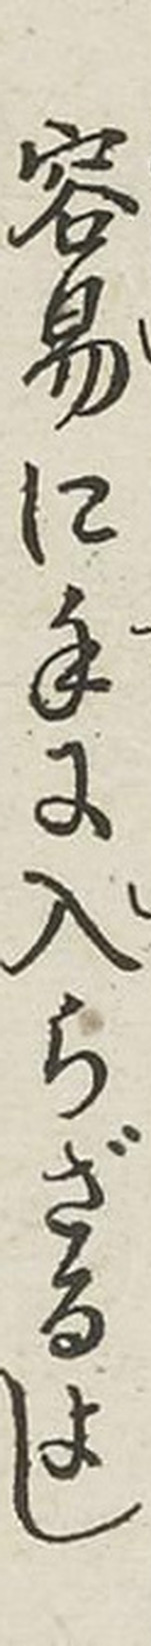容易に手に入らざるよし
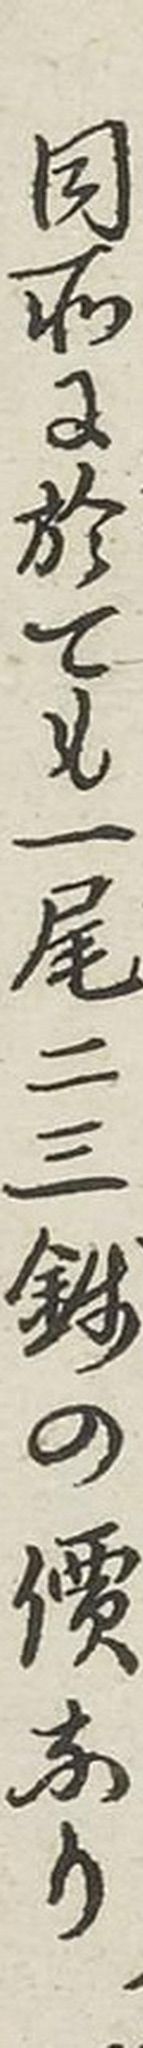同所に於ても一尾二三銭の価なり

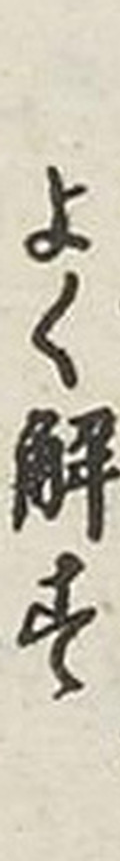よく解す
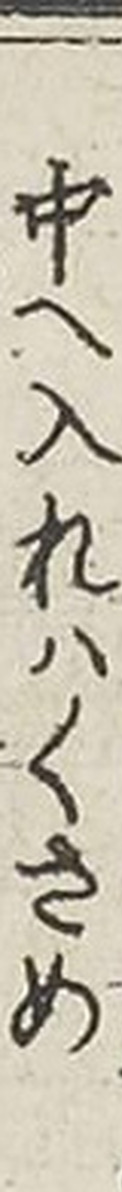中へ入れくはくさめ
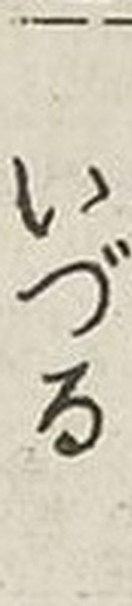いづる

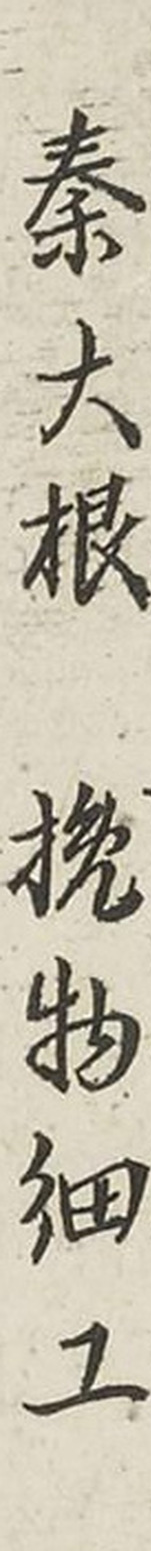秦大根挽物細工
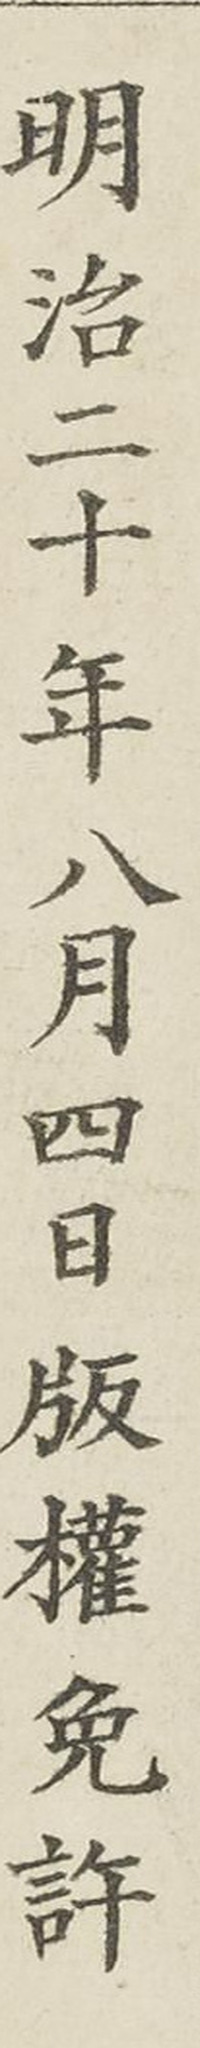明治二十年八月四日版権免許
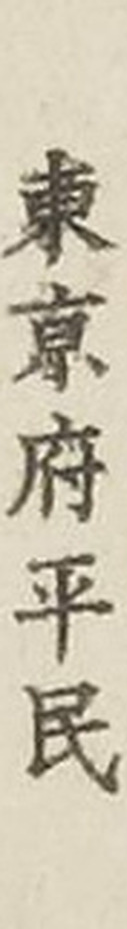東京府平民
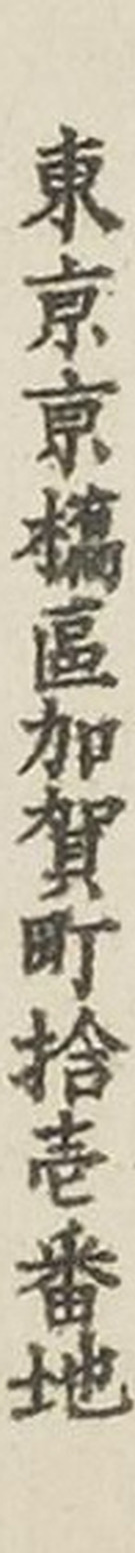東京京橋区加賀町拾壱番地
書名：箱根温泉誌　全
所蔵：東京大学地震研究所図書室 Earthquake Research Institute Library, The University of Tokyo, JAPAN
